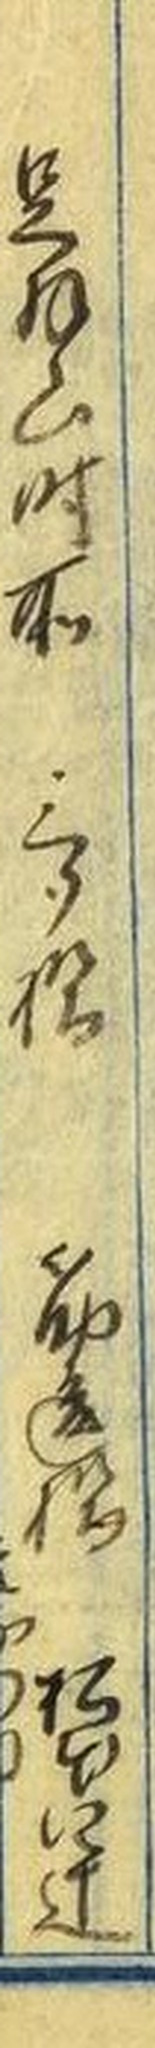足羽山時所三ッ橋筋違橋松本四辻

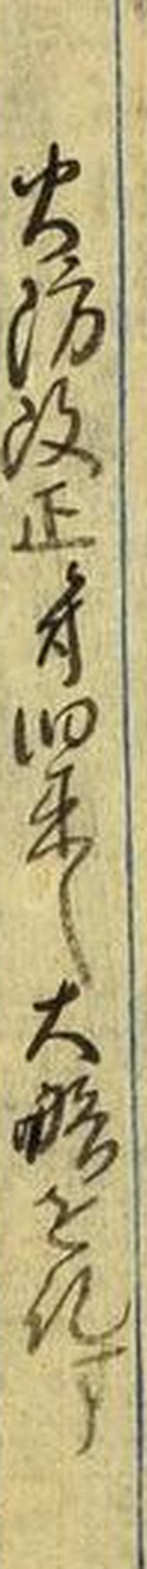火防改正に付旧来之大略を記す
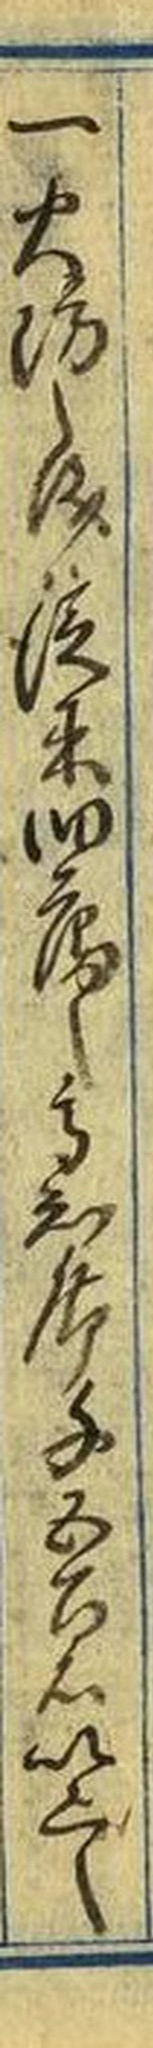一火防之儀は従来旧藩之高知序千五百石以上之
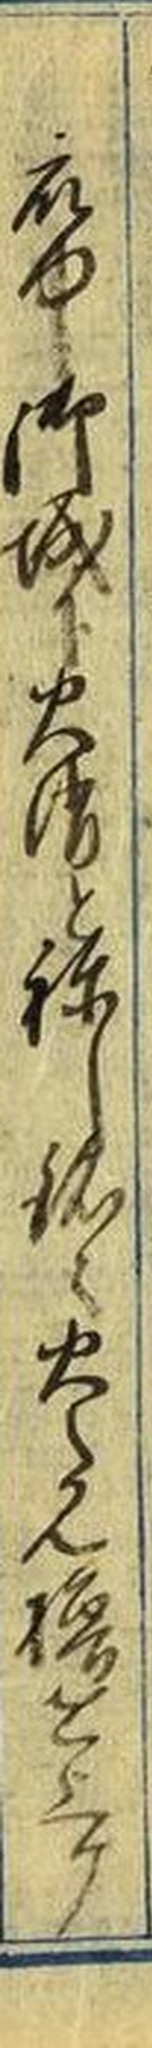衆中御城下火消と称し銘々火之見櫓を上け
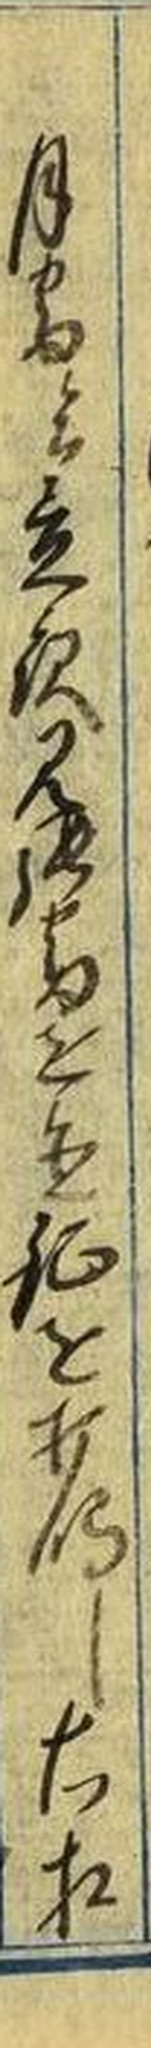月番に而昼夜見張番を置鉦を打鳴し右相
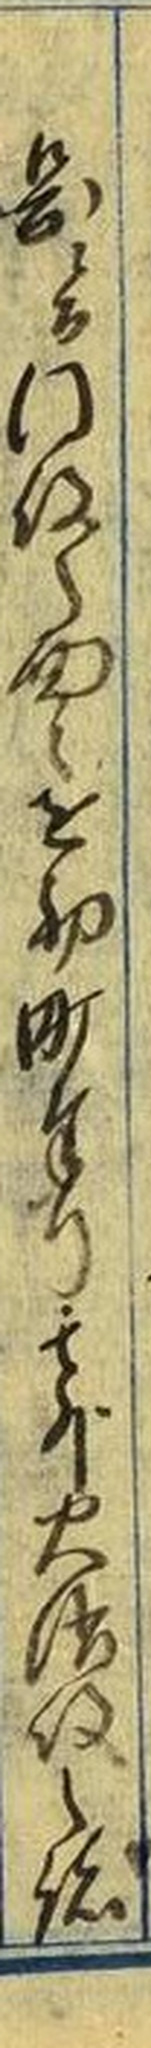図に而同役の面々を初町奉行其外火消役之諸
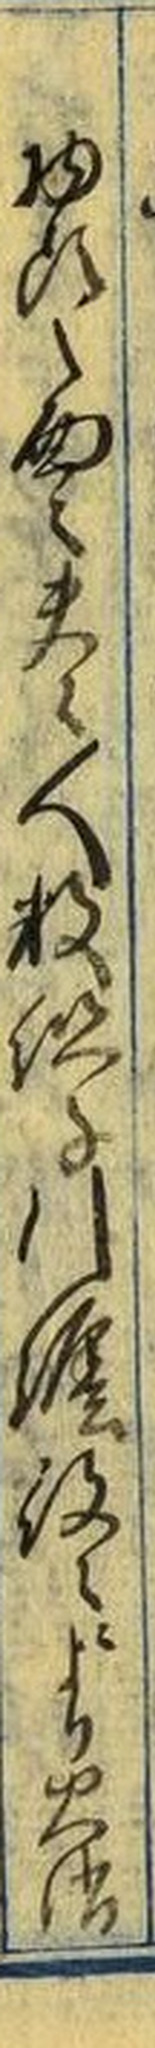物頭之面々夫々人数組子引纏役々により火消
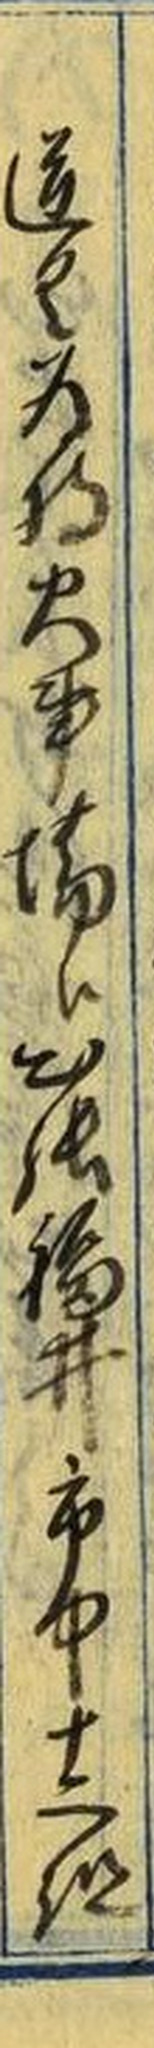道具為持火事場え出張福井市中十二組
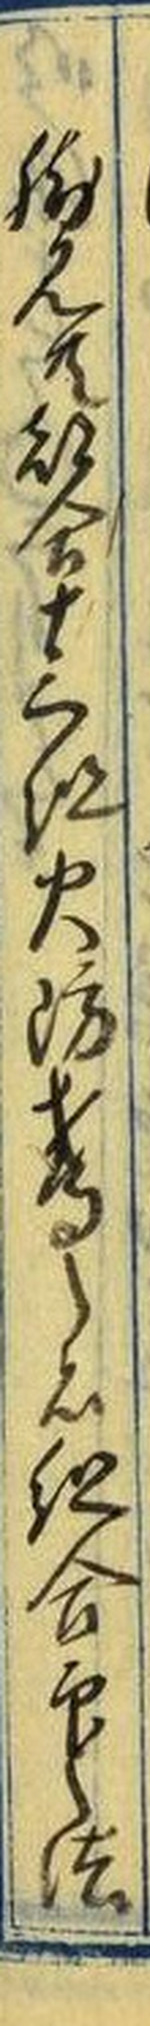勝見共都合十三組火防鳶之者組合印之法
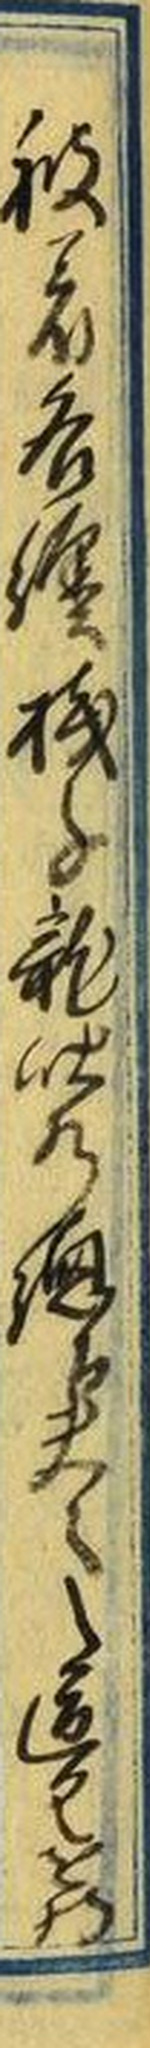被着各纏梯子龍吐水総而夫々之道具を持
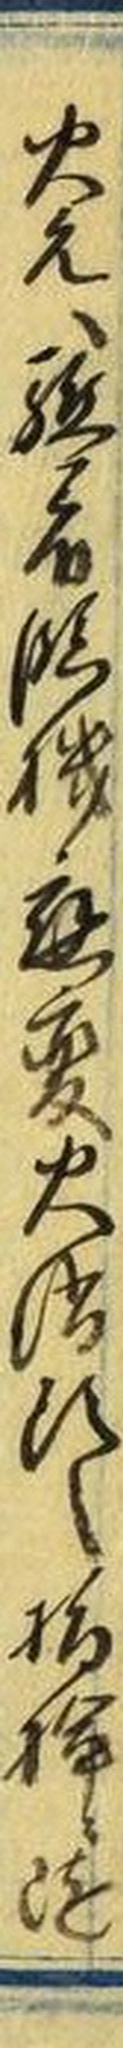火元へ駈付臨機応変火消頭之指揮に随
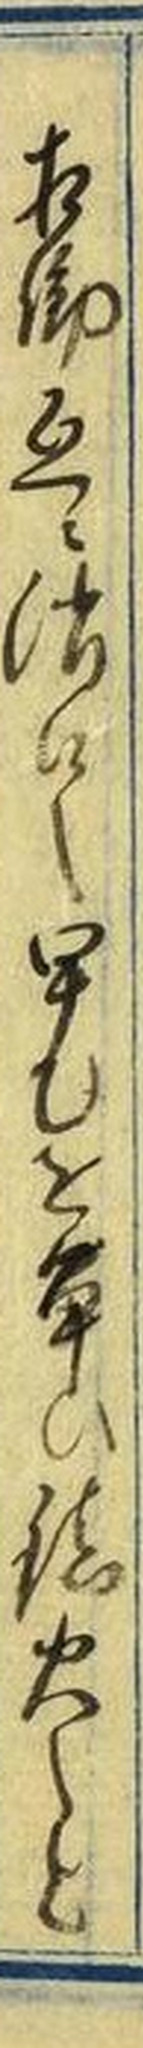相働互に消口之甲乙を争ひ鎮火之上
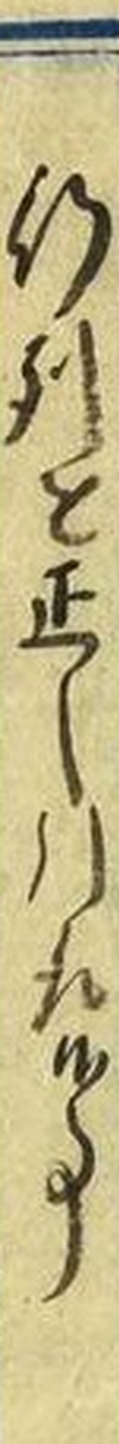行列を正し引取候事
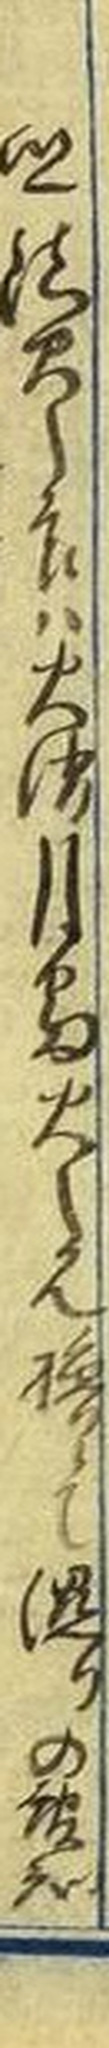但鎮火之節は火消月番之見櫓にて懲りの報知
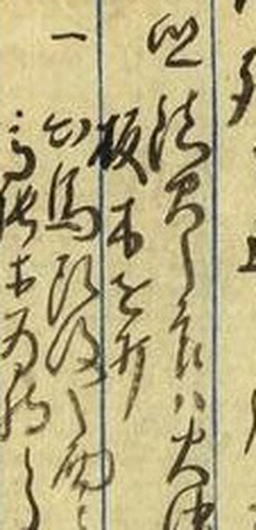板木を打
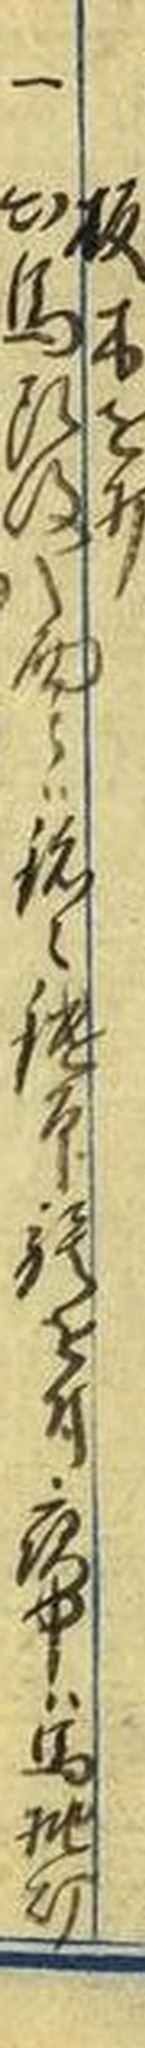一出馬頭役之面々は銘々鑓印旗を付夜中は馬挑灯
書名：温古集 五巻
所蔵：福井県文書館 Fukui Prefectural Archives
